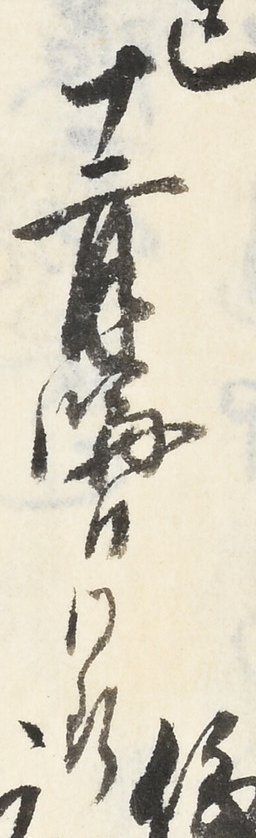十二月晦日同断
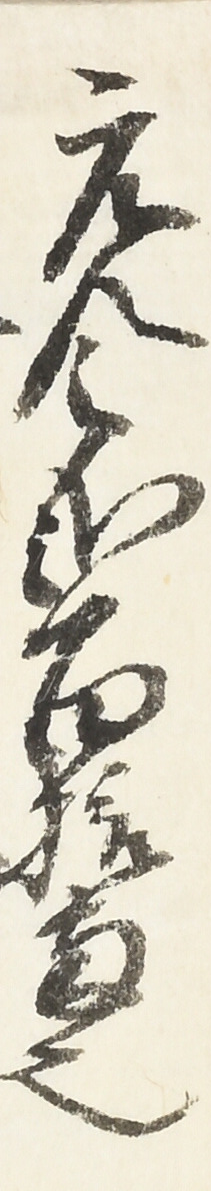元金弐百拾両也
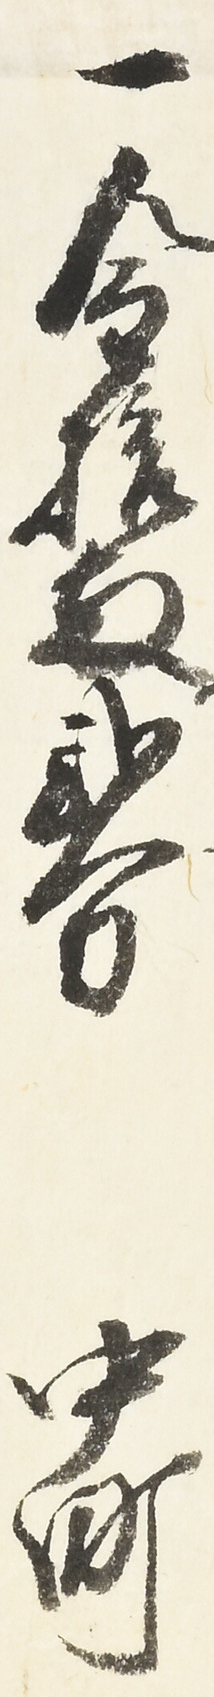一金拾両弐分中町
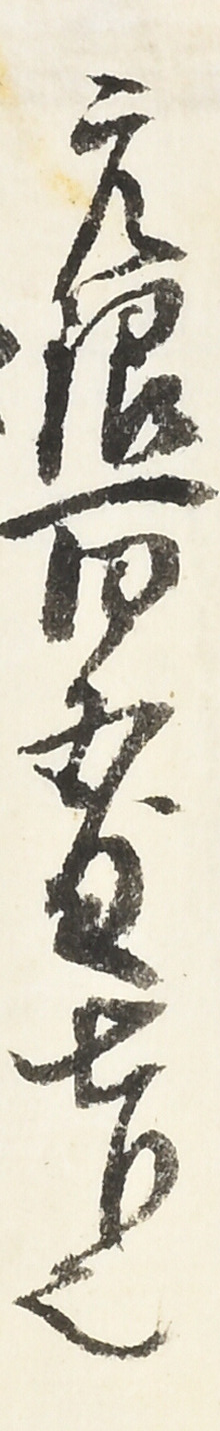元銀百五匁七分也
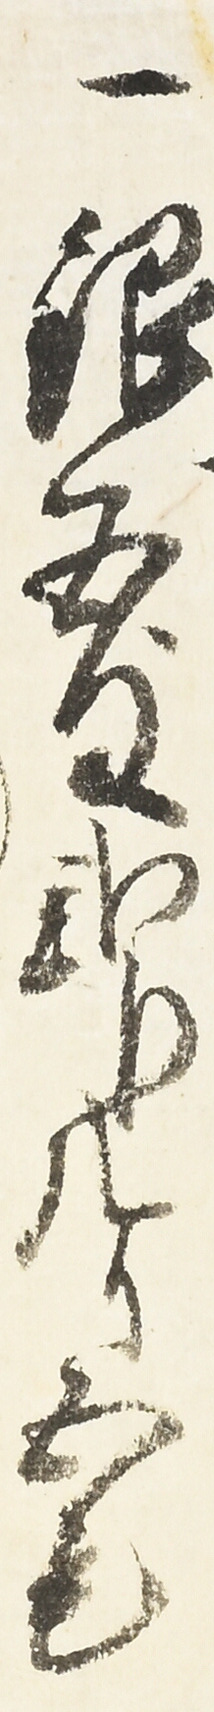一銀五匁弐分八厘五毛
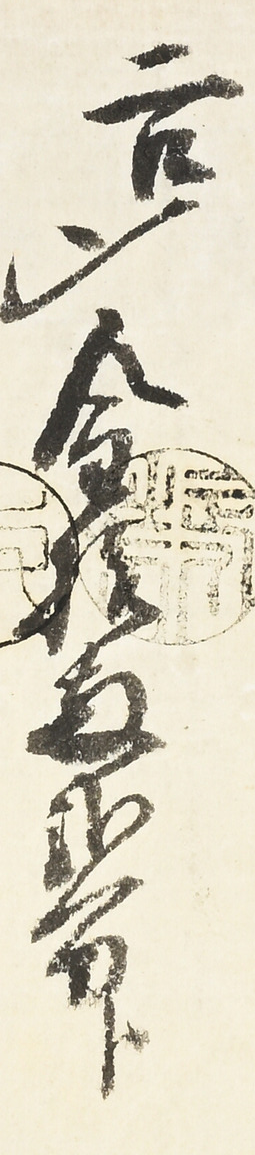二口〆金拾両弐分ト
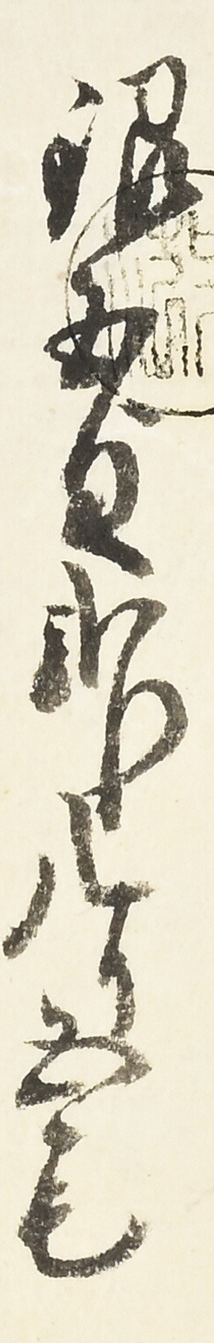銀五匁弐分八厘五毛
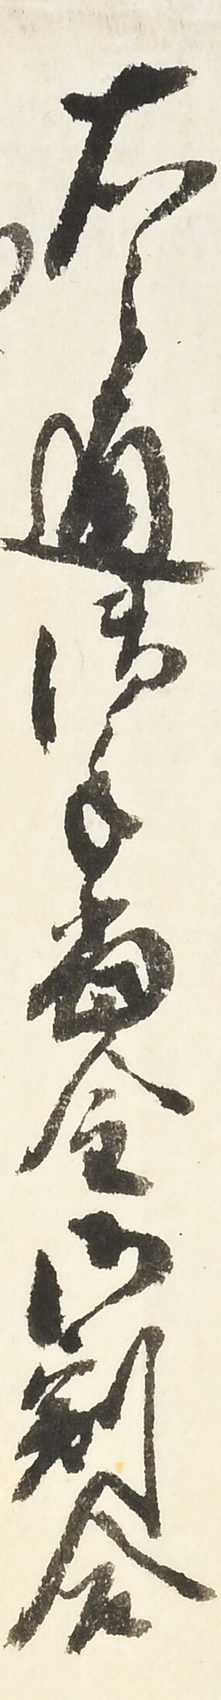右之通御手当金御割合
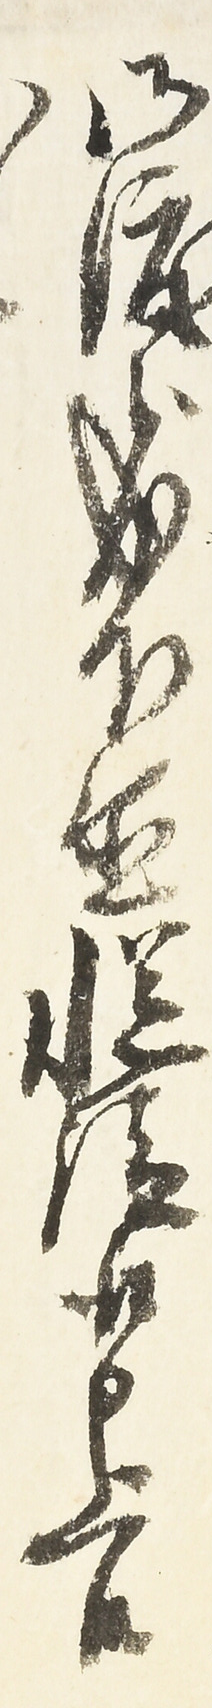御渡被成下置慥請取申上候
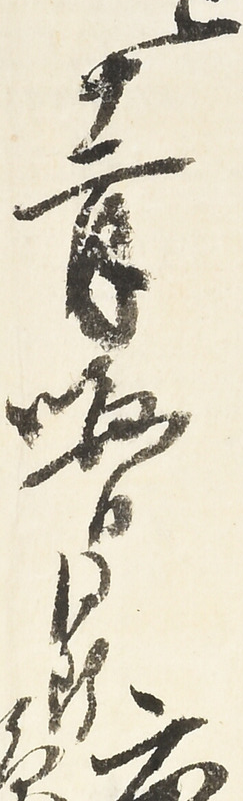十二月晦日同断
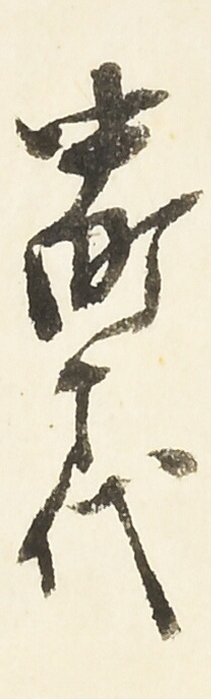中町丁代
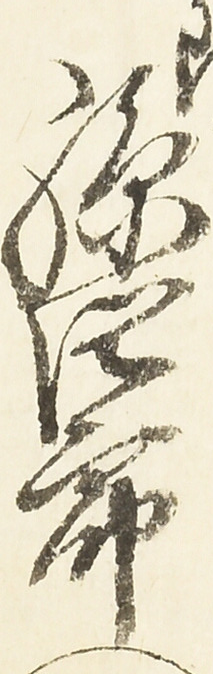孫四郎
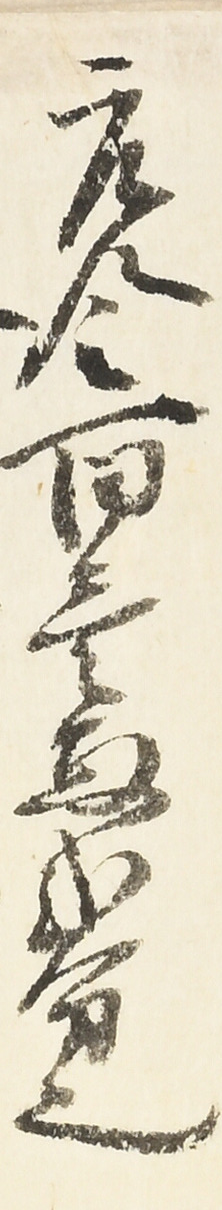元金百壱両弐分也
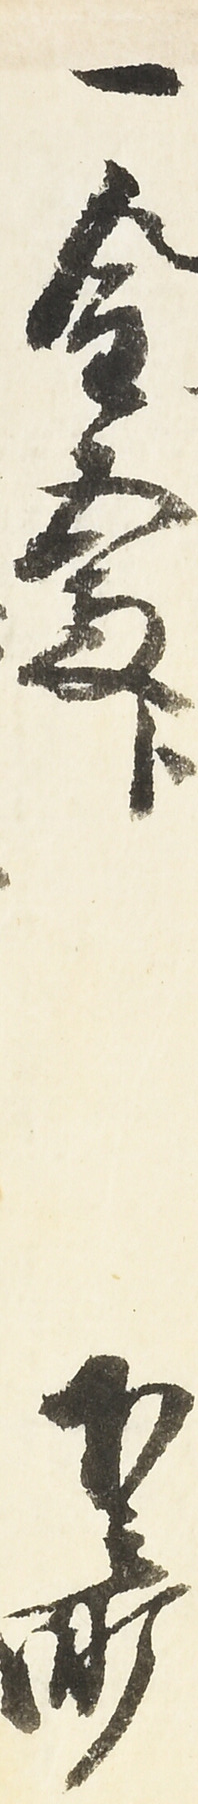一金五両ト下モ町
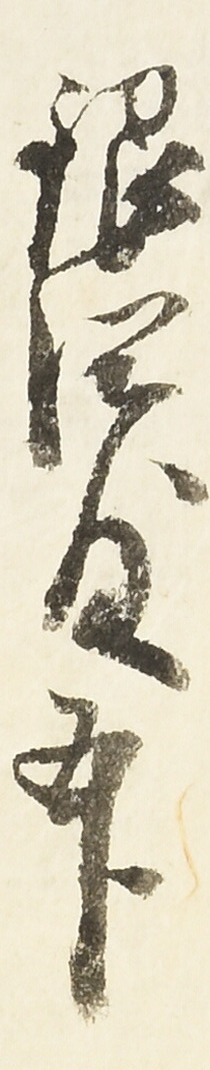銀四匁五分
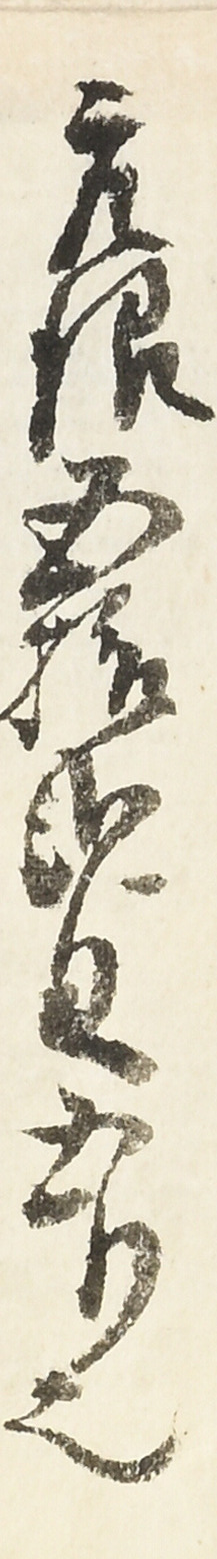元銀五拾弐匁五厘也
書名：御才覚金御利足割渡扣帳
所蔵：伊那市立高遠町図書館・合同会社AMANE
